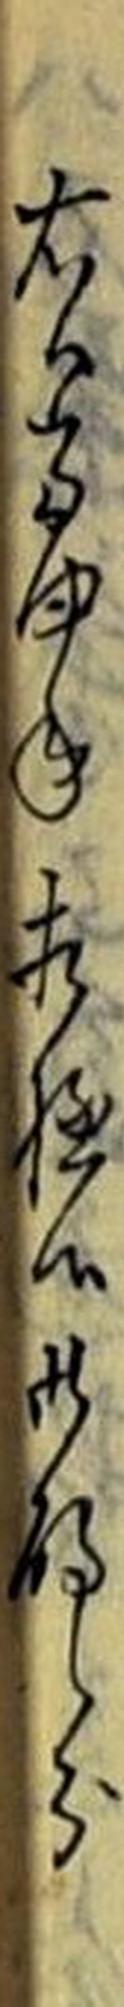右は当申年相極候御触之分
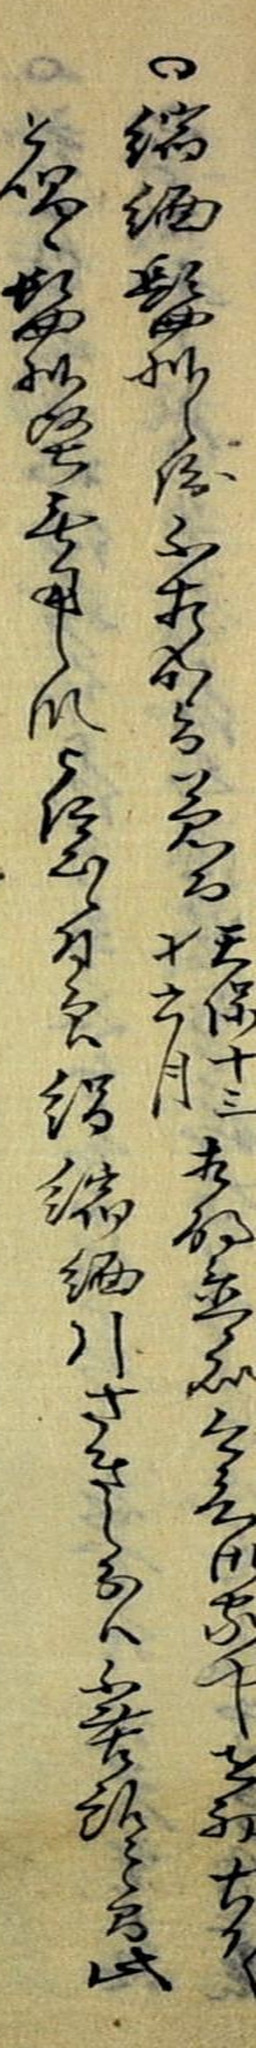と唱候髷掛堅無用之段被仰出候に付而は絹縮緬引さき之分は不苦趣に候間此
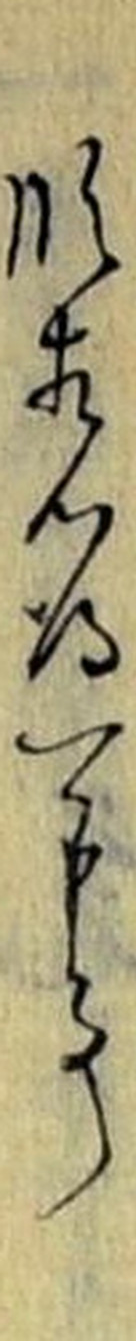段相心得可申事
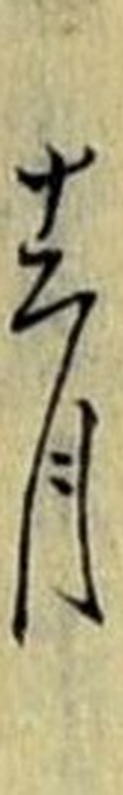十二月
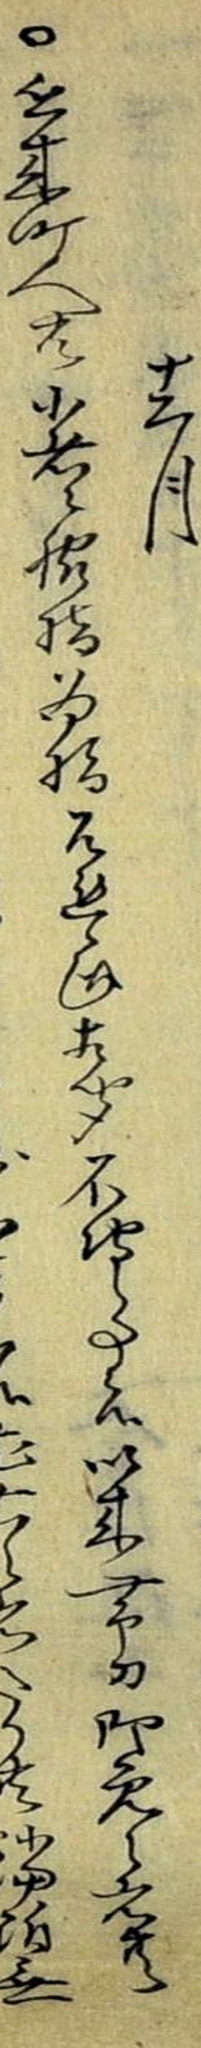○近来町人共小者に脇指為指召連趣相聞不埒之事に候以來帯刀御免之者共
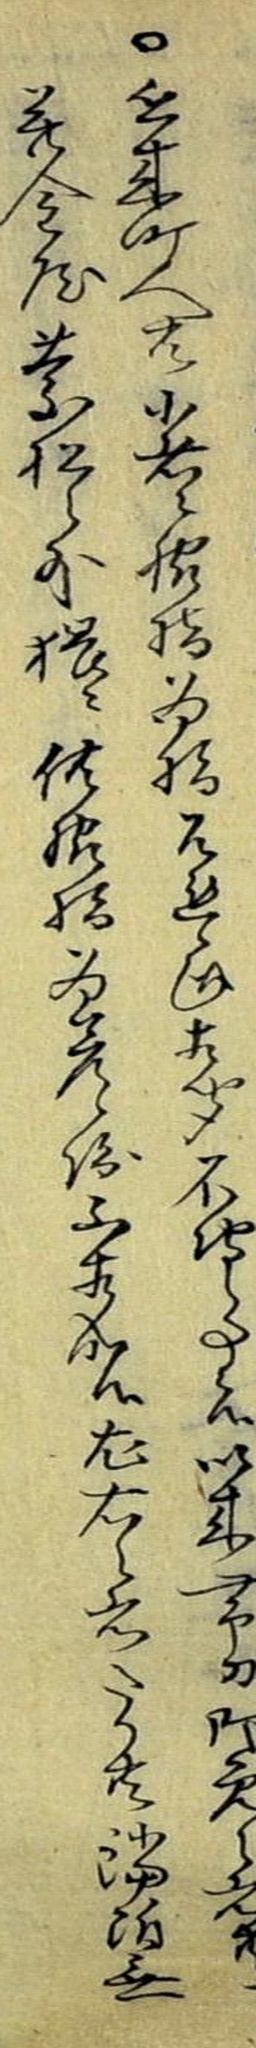井金屋慶松之外猥に供脇指為差候儀不相成候尤右之者たり共鞘附無
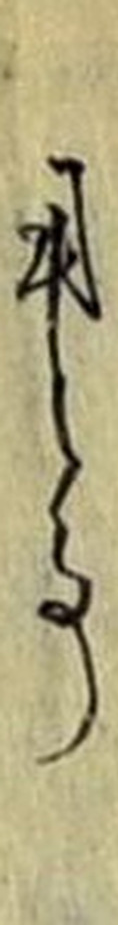用之事
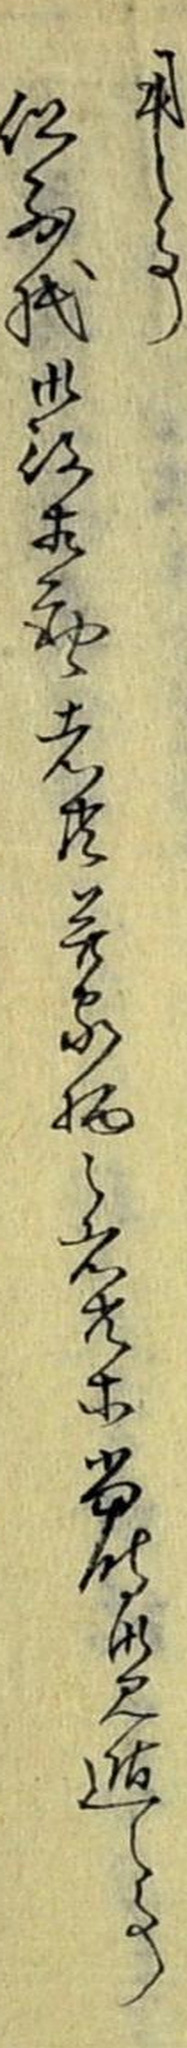但別紙御役等相勤候者共井家柄之者共等当時御見遁之事
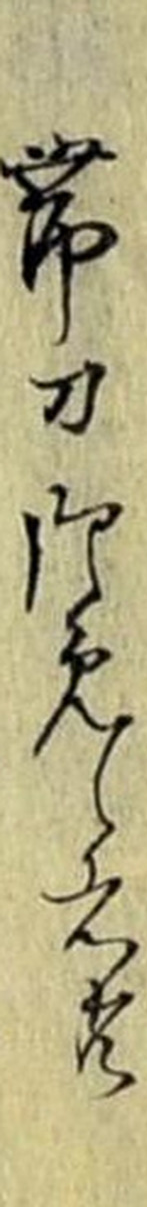帯刀御免之者共
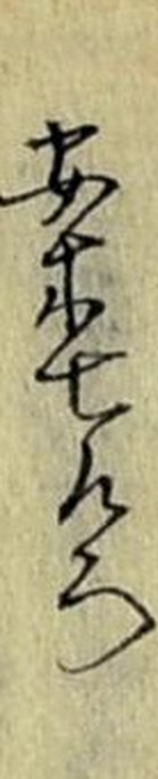妻木七左衛門
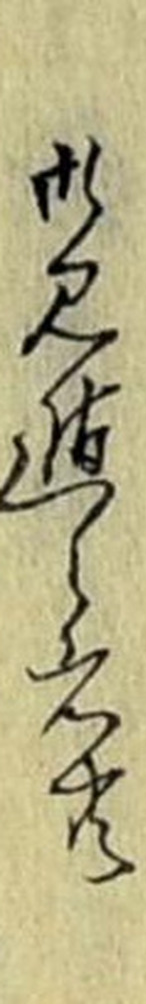御見遁之者共
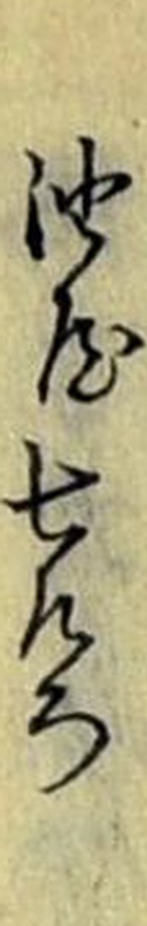妻木七左衛門

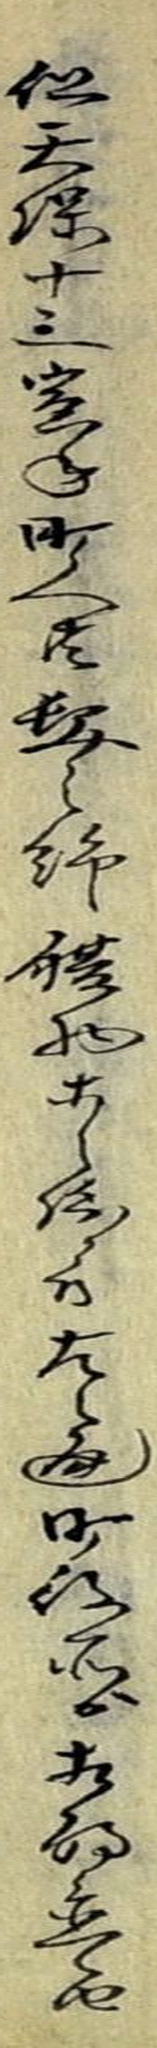但天保十三寅年町人共髪之飾履物等之儀に付左之通町役所ゟ相触置候由
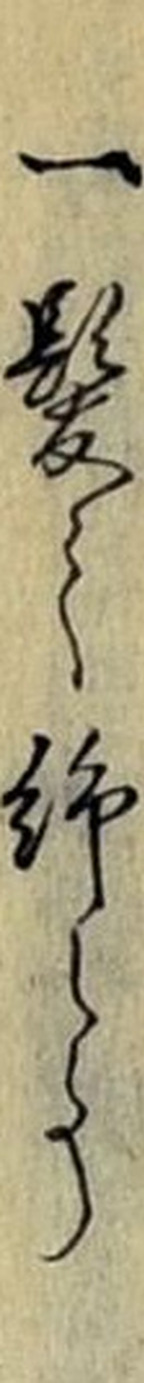一髪之飾之事
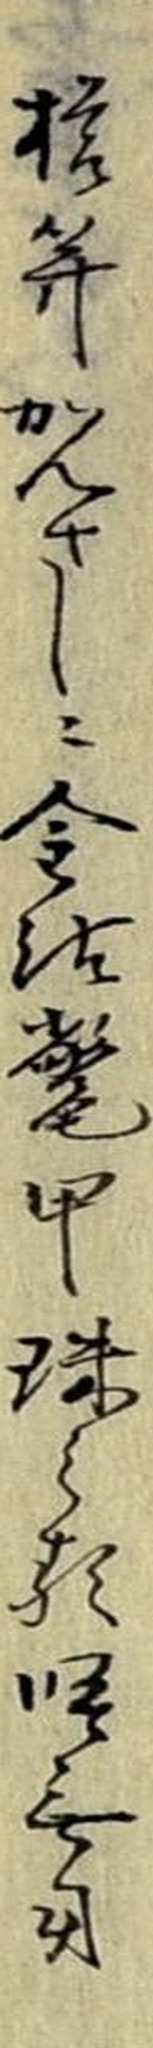櫛笄かんさしに金銀鼈甲珠之類堅無用
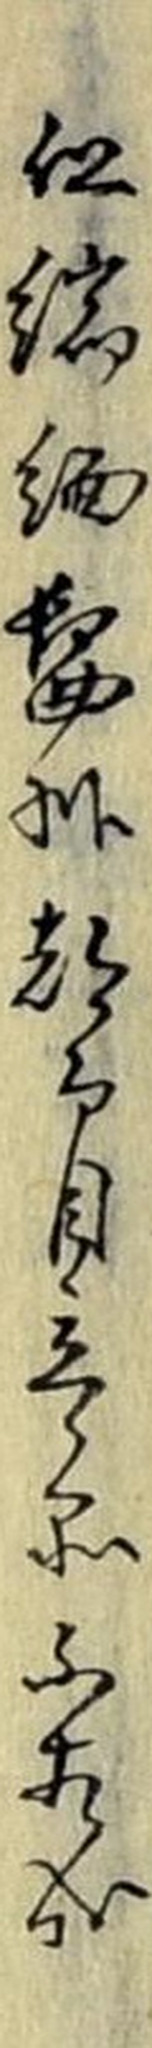但縮緬髷掛都而目立候品不相成
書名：命令之部 六
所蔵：福井県文書館 Fukui Prefectural Archives
